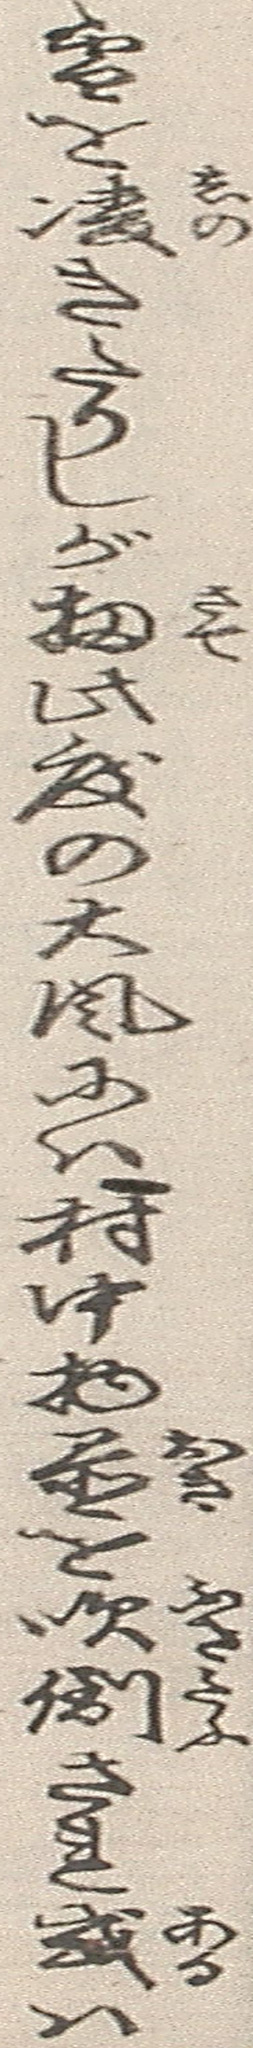雪を凌きたりしが扨此度の大風にハ村中物置を吹倒され或ハ
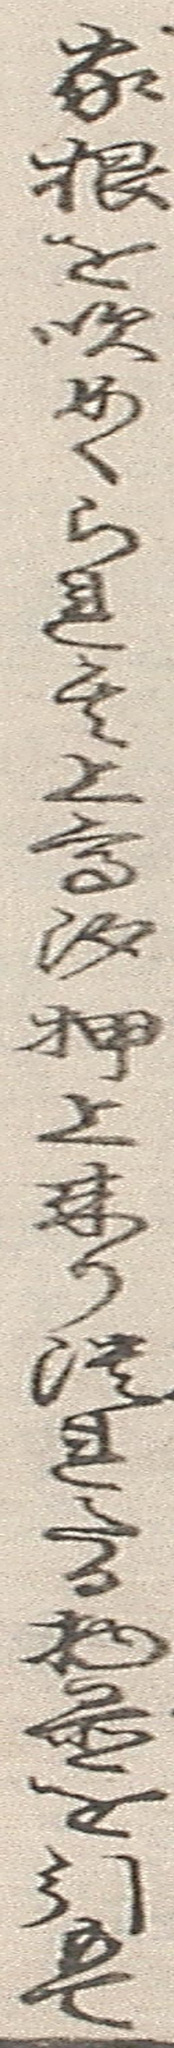屋根を吹めくらられ其上高汐押上来り潰れたる物置を引もて
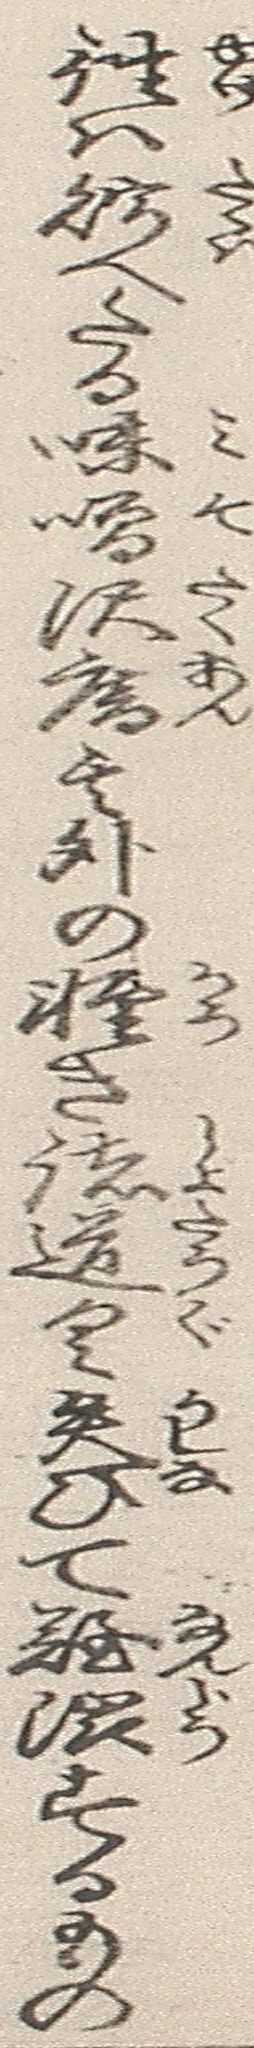往ハ貯へたる味噌沢庵其外の輕き諸道具を失ひて難渋するもの
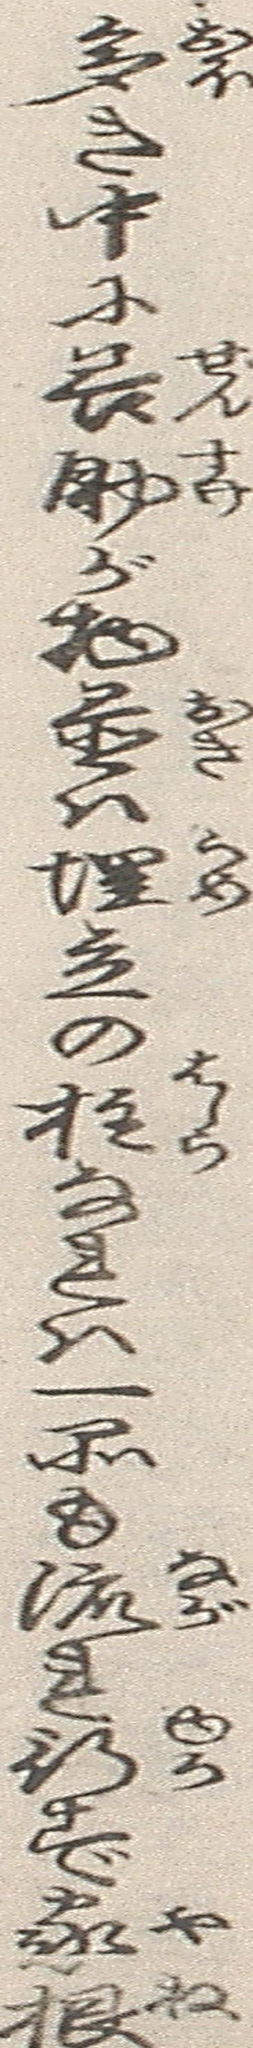多き中に善助が物置ハ埋立の柱なれハ一品も流れ行ず屋根
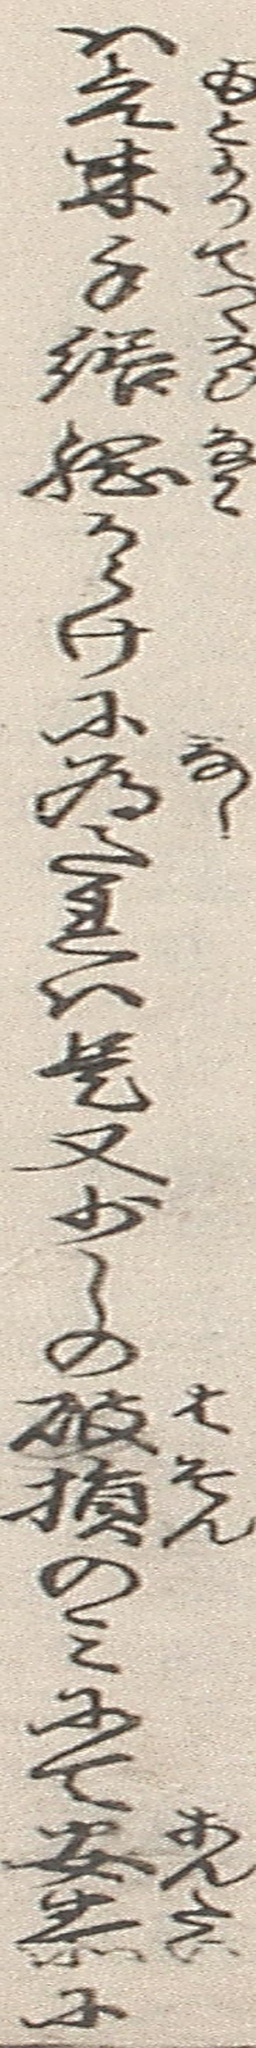ハ元来手繕縄からけに為たれハ是又少しの破損のミにて安泰に
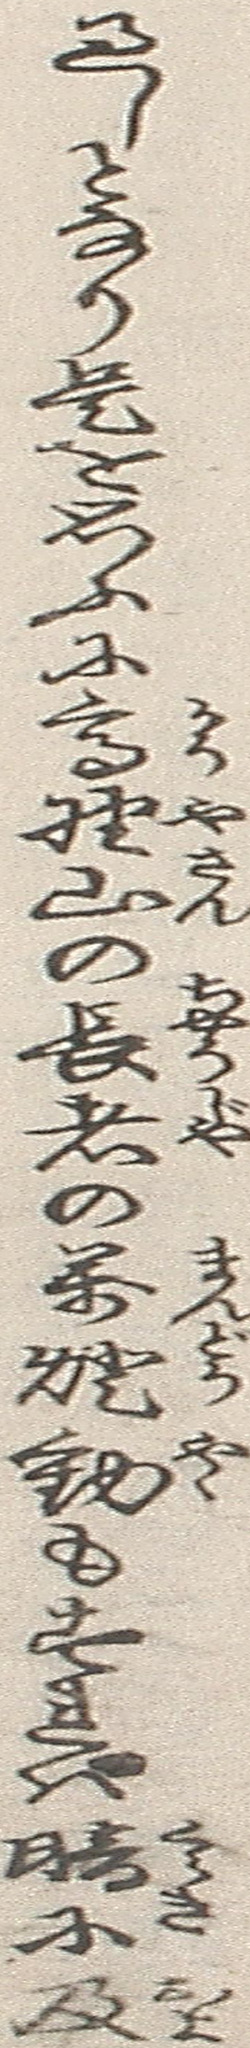過しことなり是を思ふに高野山の長者の万燈動もすれハ暗に及
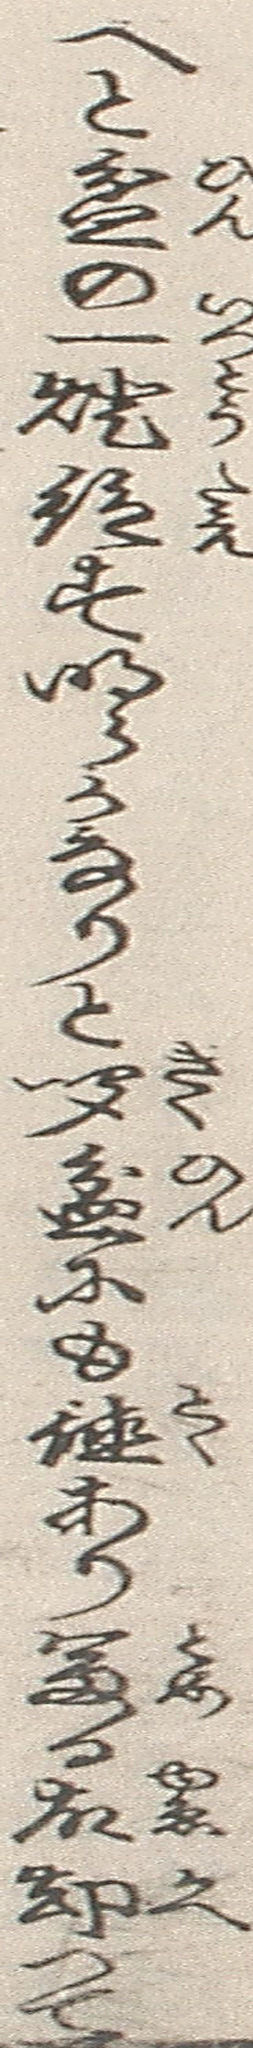へと貧の一燈絶す明らかなりと聞貧にも徳あり富る故却って
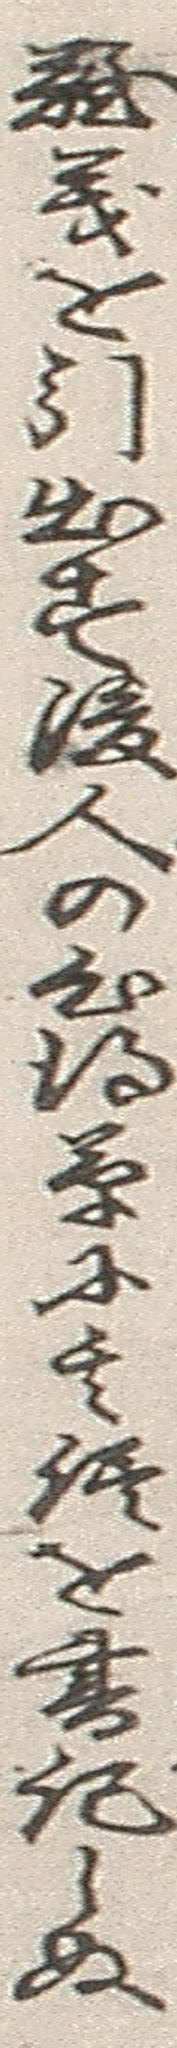難義を引出す後人の心得筆に其侭を書記しぬ
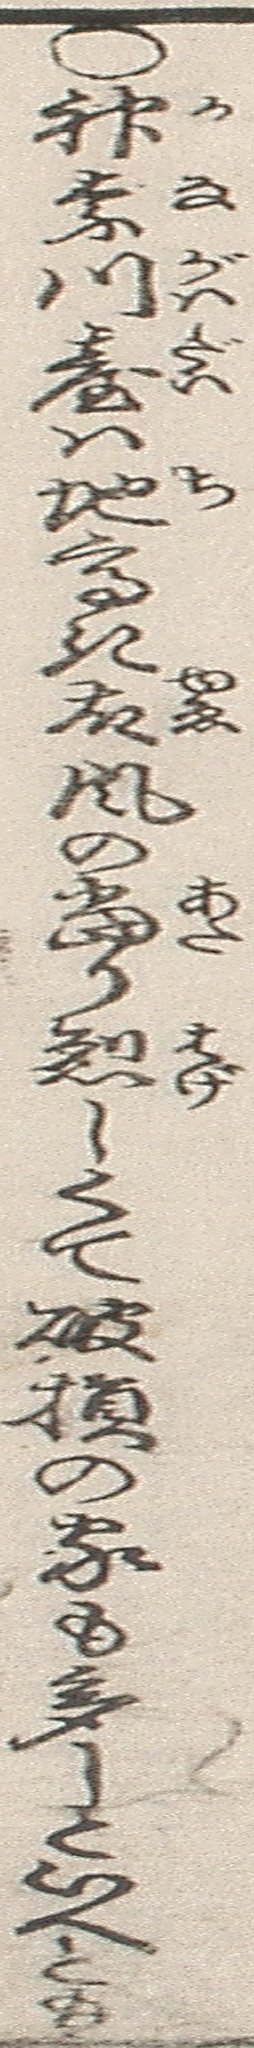◯神奈川臺ハ地高き故風の当り激しくて破損の家も多しといへとも
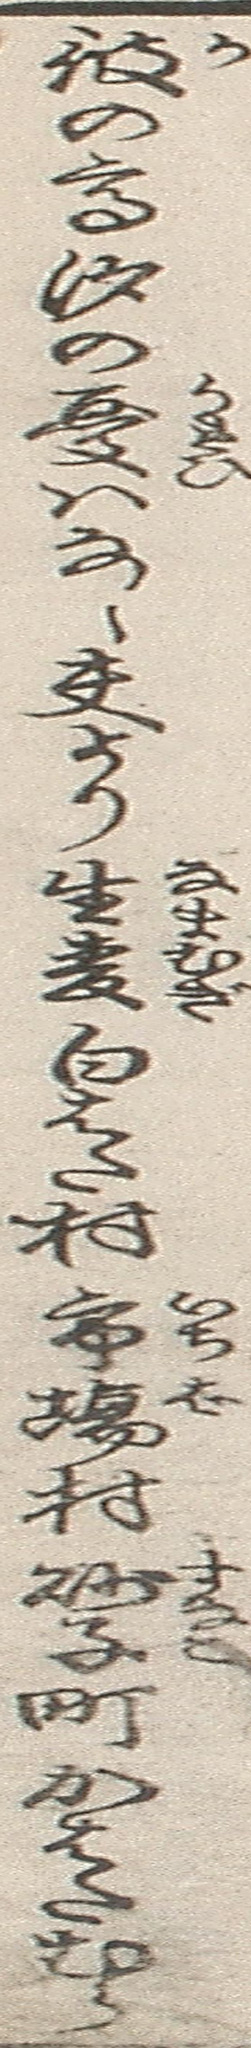彼の高汐の憂ハなし夫より生麦白はた村市場村砂子町かはたむら
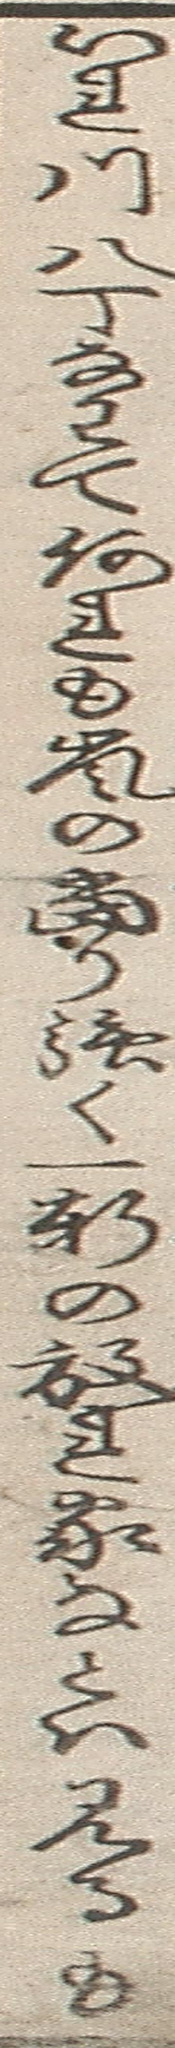いれ川八丁なわて何れも嵐の当り強く一軒の放れ家なとハ見るも

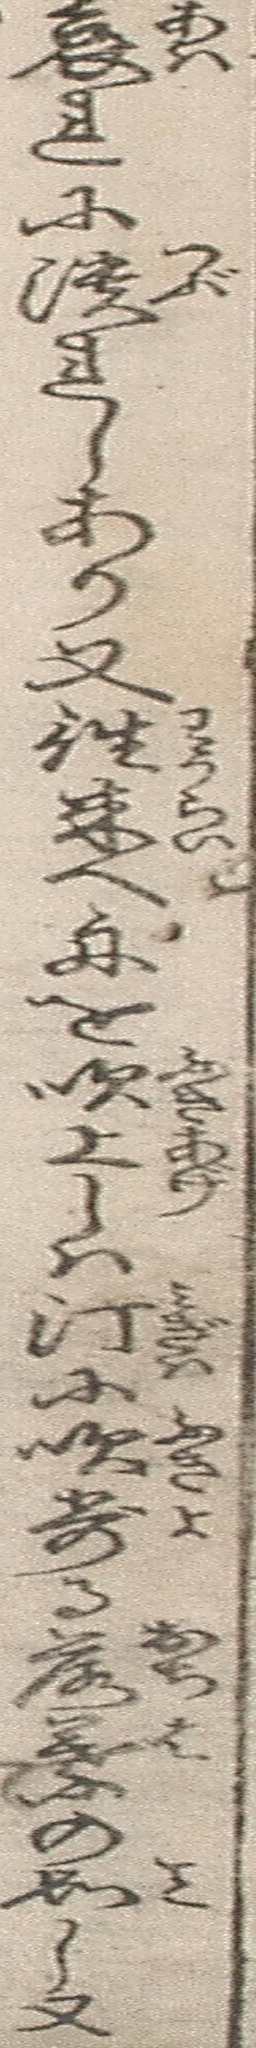哀れに潰れしあり又往来へ舟を吹上しハ汀に吹寄る落葉の如く又
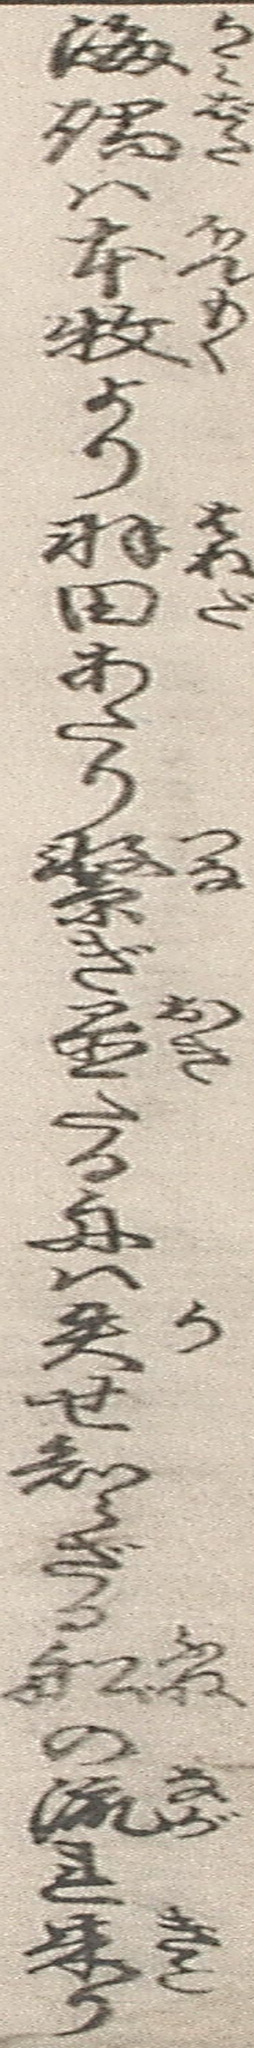うミばた）ハ本牧より羽田あたり繋ぎ置たる舟ハ失せ知らざる船の流れ来り
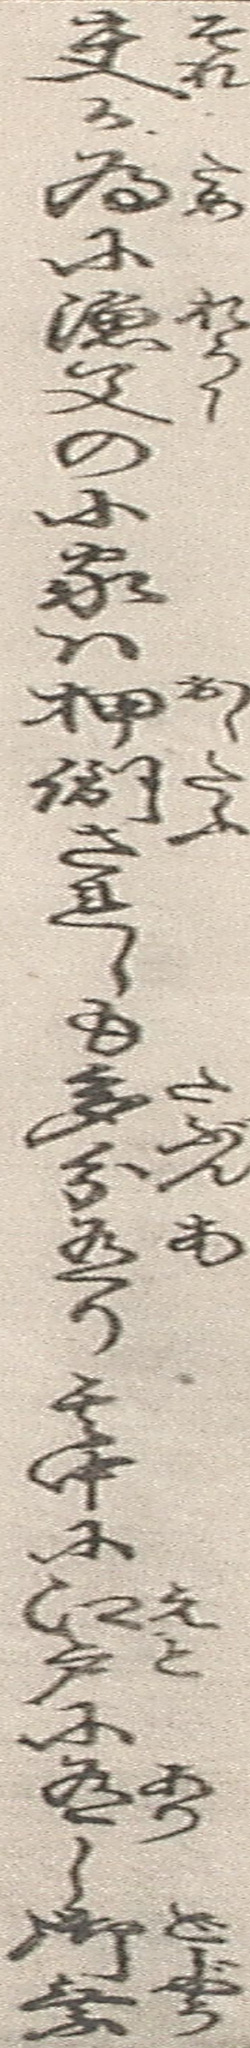夫か為に漁父の小屋ハ押倒されしも多分有り其中に江戸に有し御乗
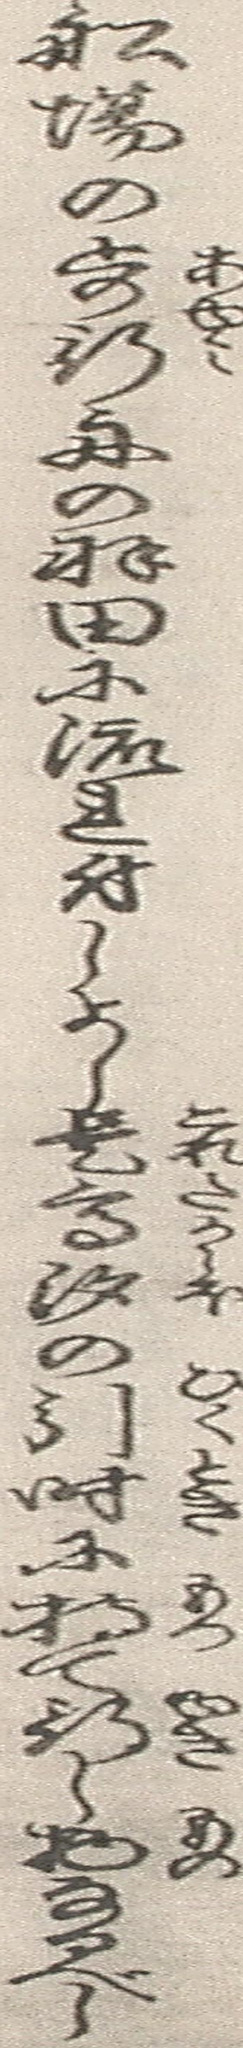船場の歩行舟の羽田に流れ付しよし是高汐の引時に持て行し物なるべし
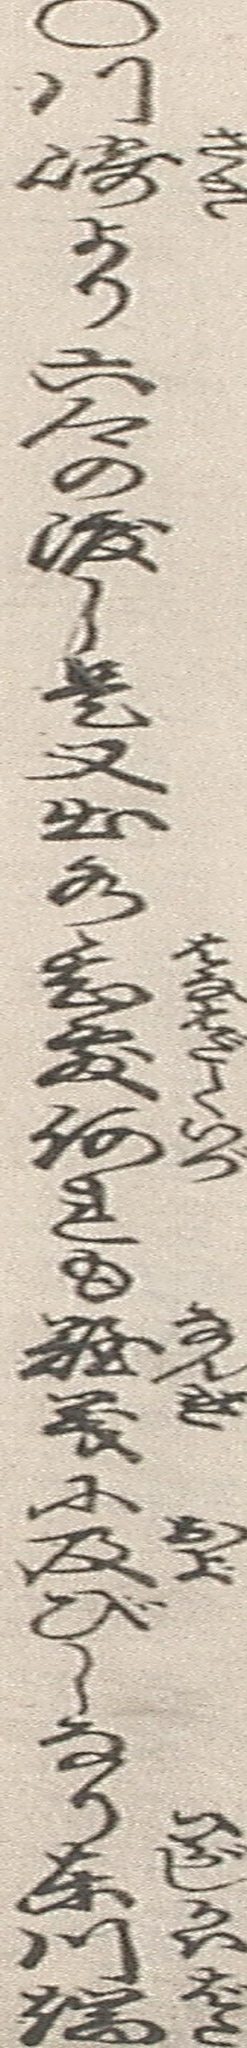◯川崎より六郷の渡し是又出水甚敷何れも難義に及びしなり東川端
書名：安政風聞集　上中下　全
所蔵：東京大学地震研究所図書室 Earthquake Research Institute Library, The University of Tokyo, JAPAN
